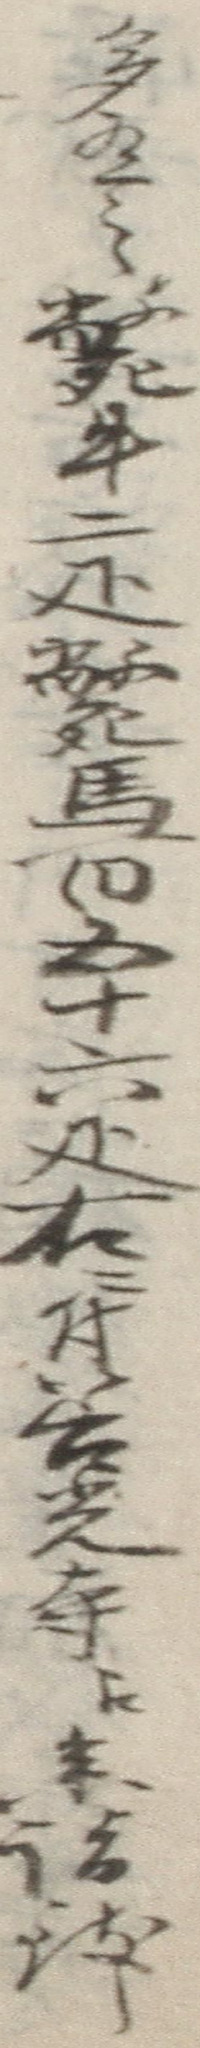多有之斃牛二疋斃馬百五十六疋右ニ付善光寺え参詣致し
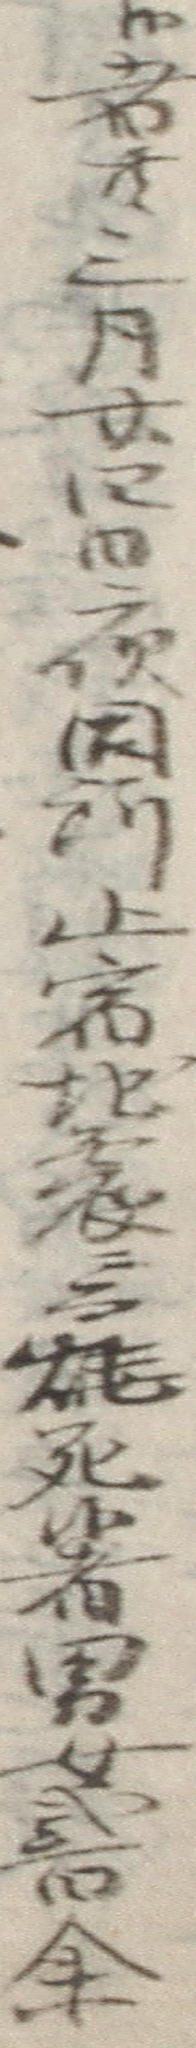候者共三月廿四日夜同所止宿地震ニ而焼死候者男女弐百余
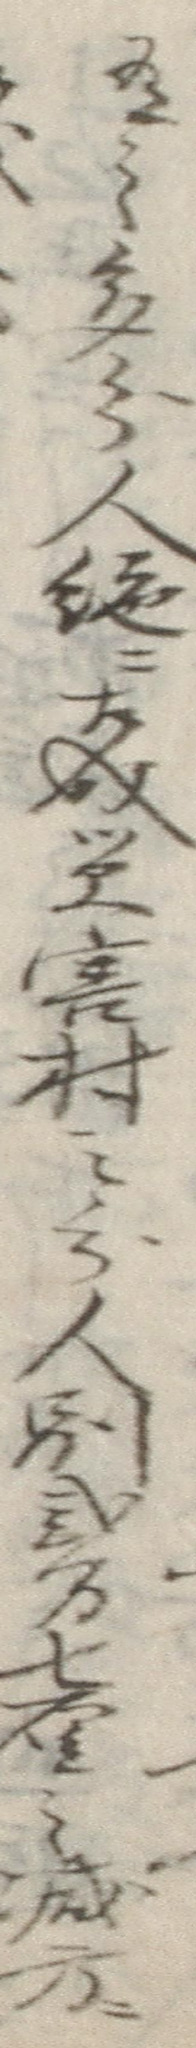有之多分人絶ニ相成災害村之分人別弐分七厘之減方ニ
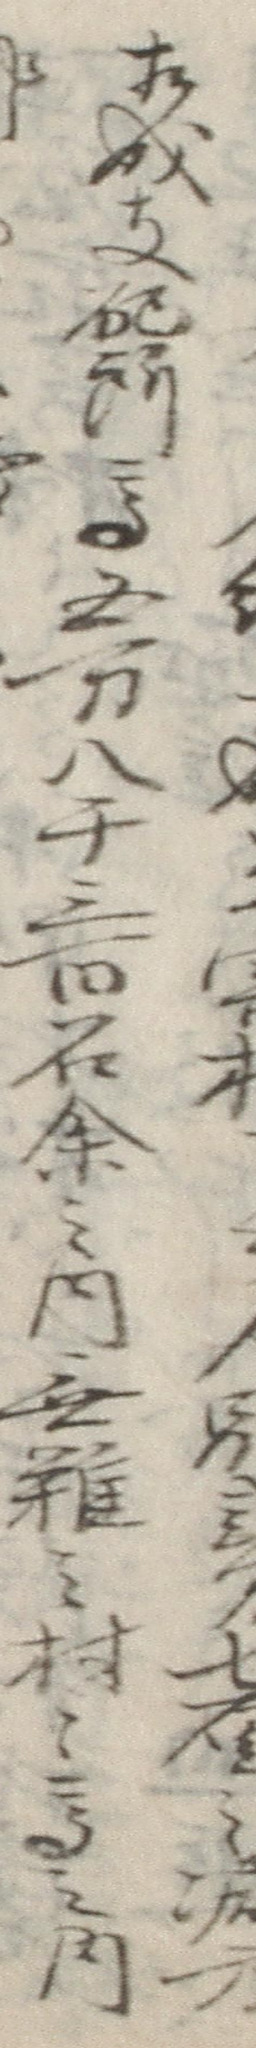相成支配所高五万八千三百石余之内無難之村々高之内
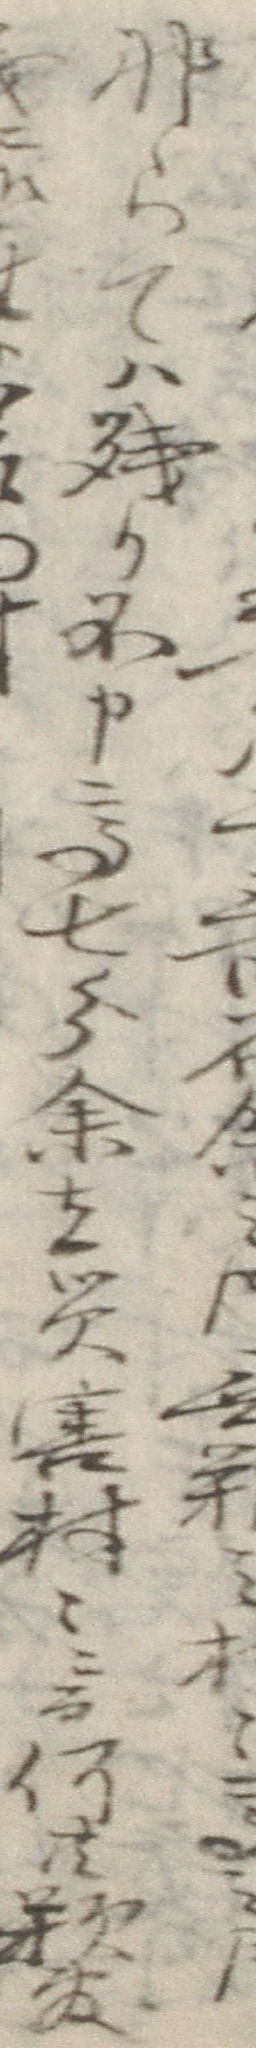ならてハ残り不申高八千三百石余は災害村々ニ而何共歎敷
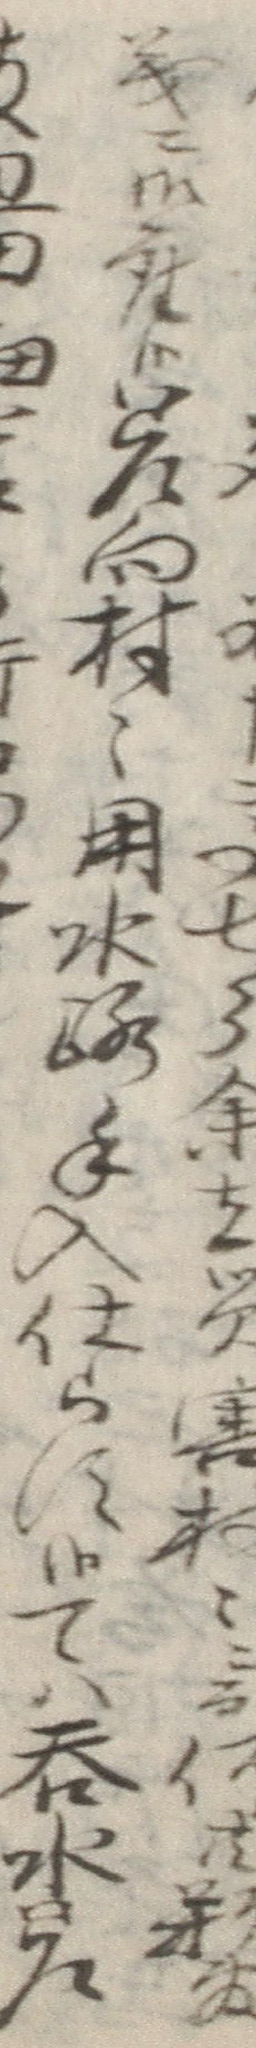義ニ御座候差向村々用水路手入仕らす候てハ呑水差
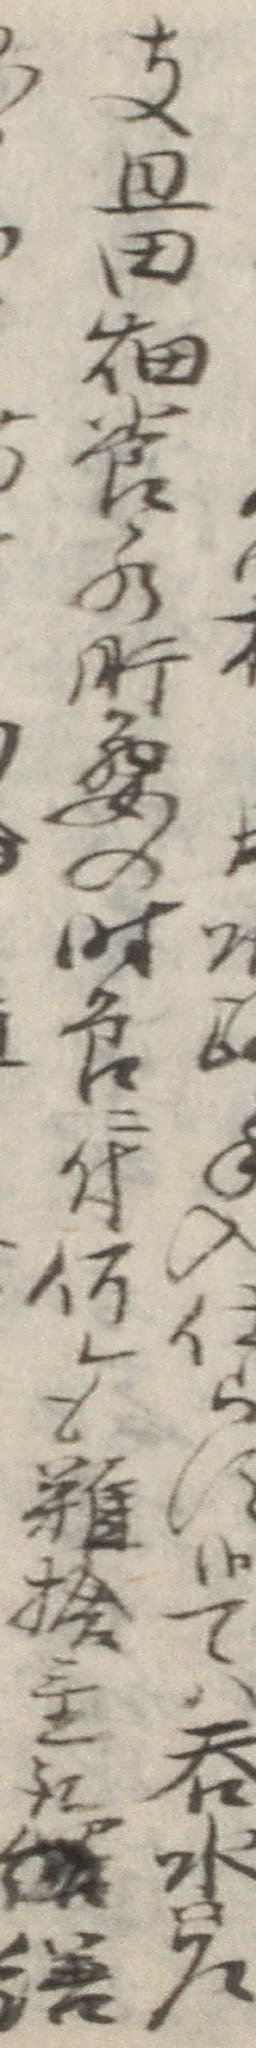支且田畑養水肝要の時節ニ付何レも難捨置取繕
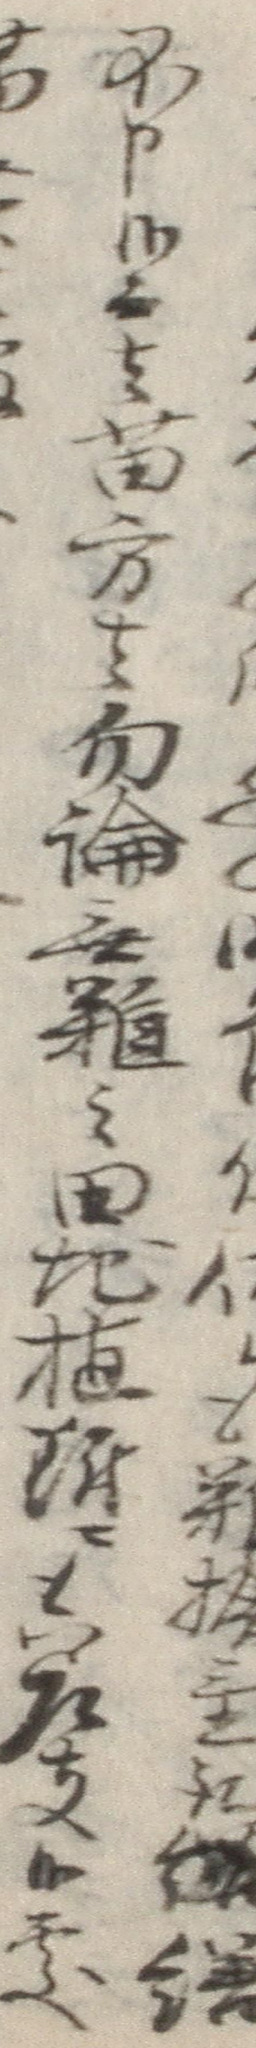不申候而は苗方は勿論無難之田地植附ニも差支候処
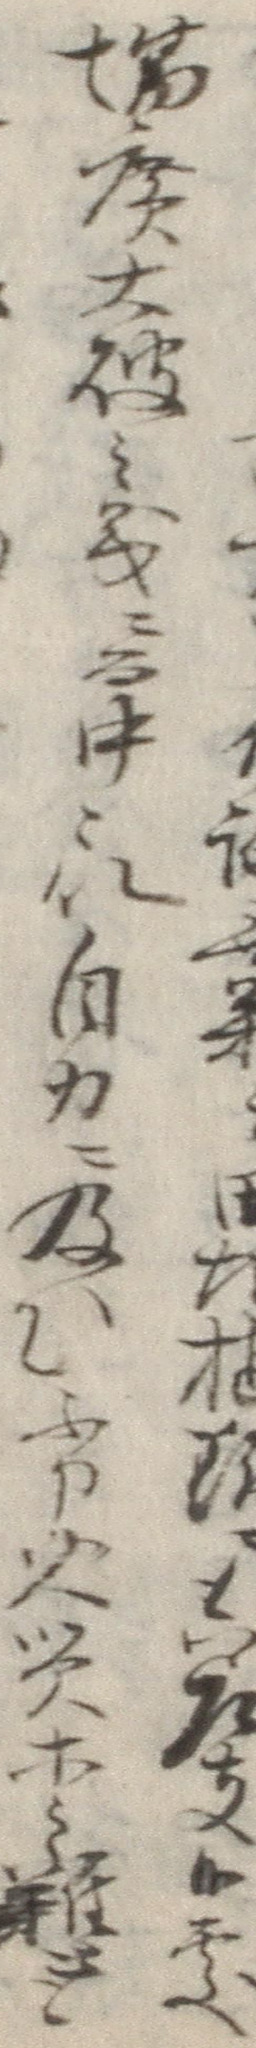場廣大破之義ニ而中々以自力ニ及ひ不申火災等之難ニも
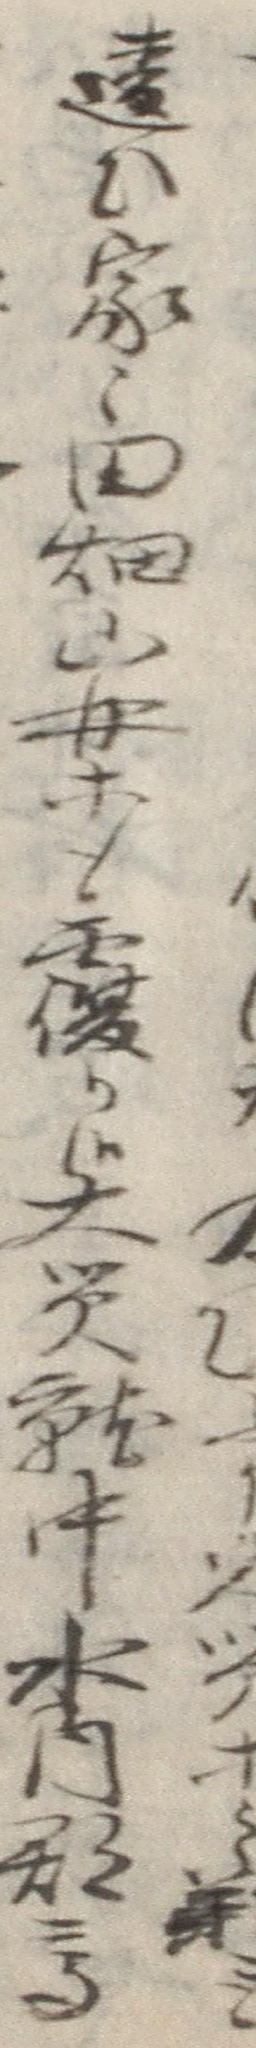違ひ家々田畑山林等も覆り候大災就中水内郡高
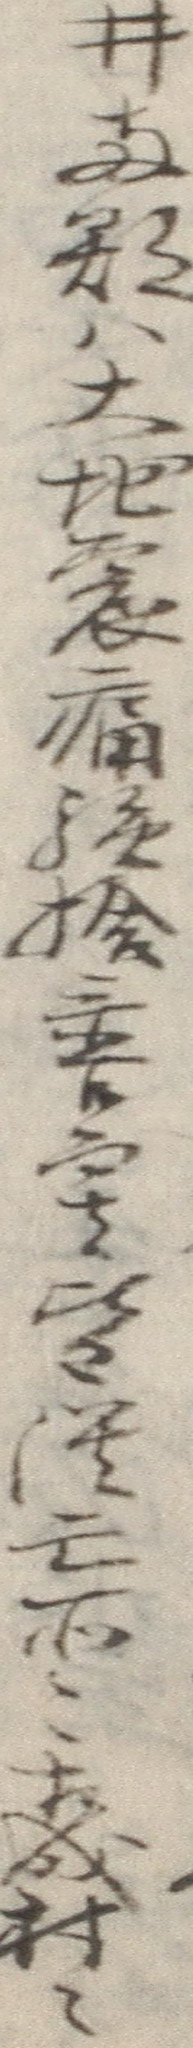井両郡ハ大地震痛絶捨置候而は皆潰亡所ニ相成村々
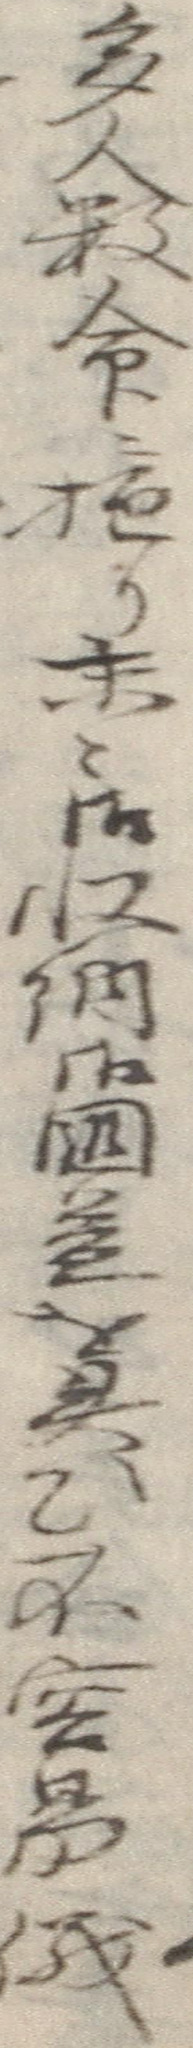多人数命ニ拘り末々御収納御国益を失ひ不容易儀
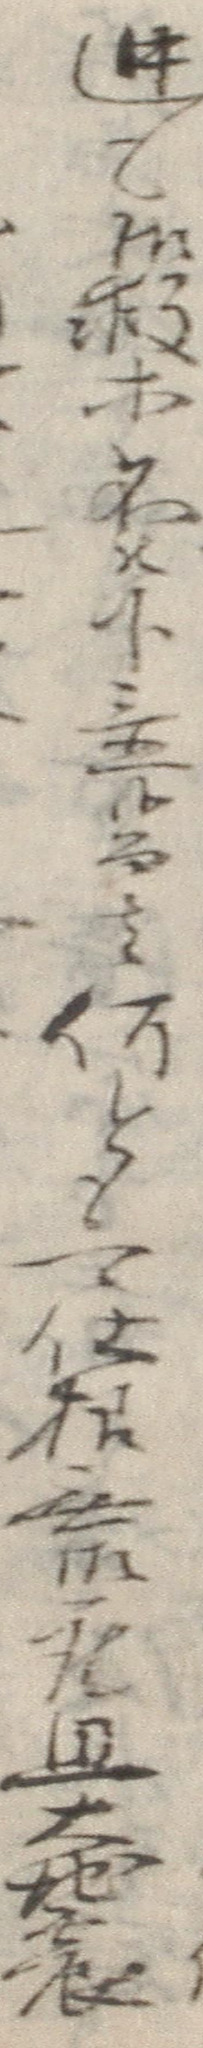迚て御救等不被下置候而は何とも可仕様無御座且大地震
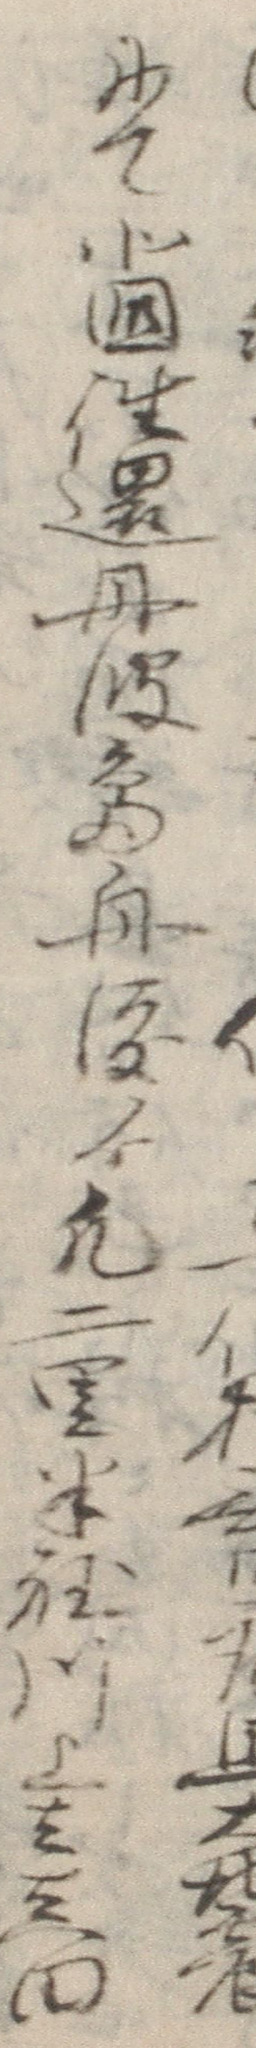にて北國往還丹波島舟渡ゟ凡二里半程川上は真田
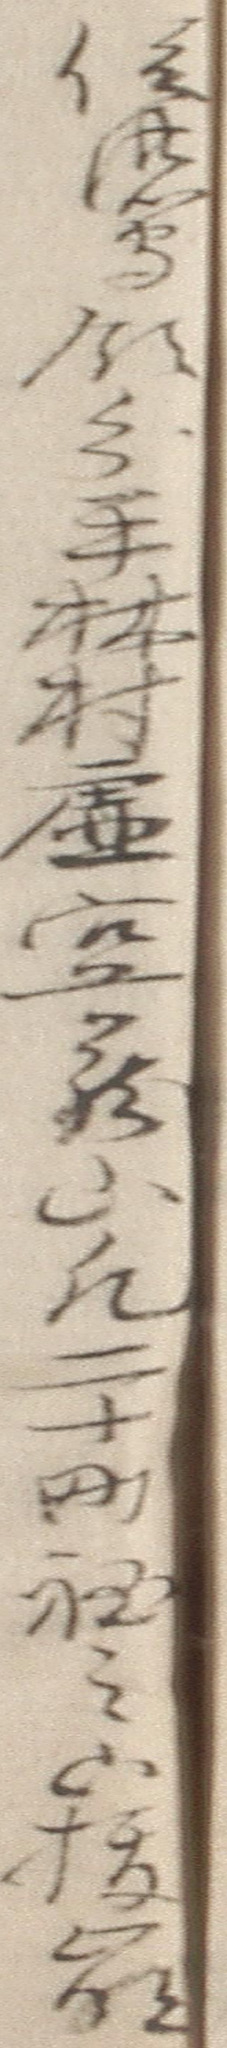信濃守領分平林村虚空蔵山凡二十町程之山抜崩
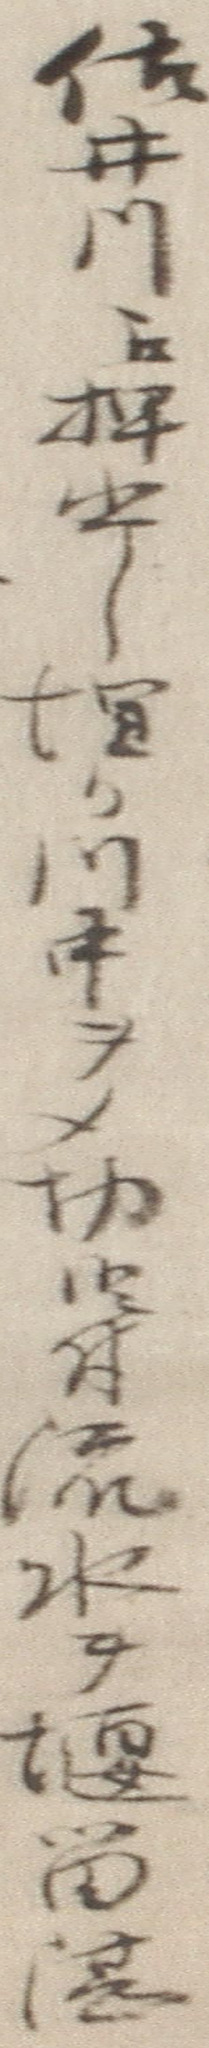佐井川え押出し埋り川中ヲメ切候ニ付流水ヲ堰留湛
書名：[善光寺地震に関する冊子]
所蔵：東京大学地震研究所図書室 Earthquake Research Institute Library, The University of Tokyo, JAPAN
